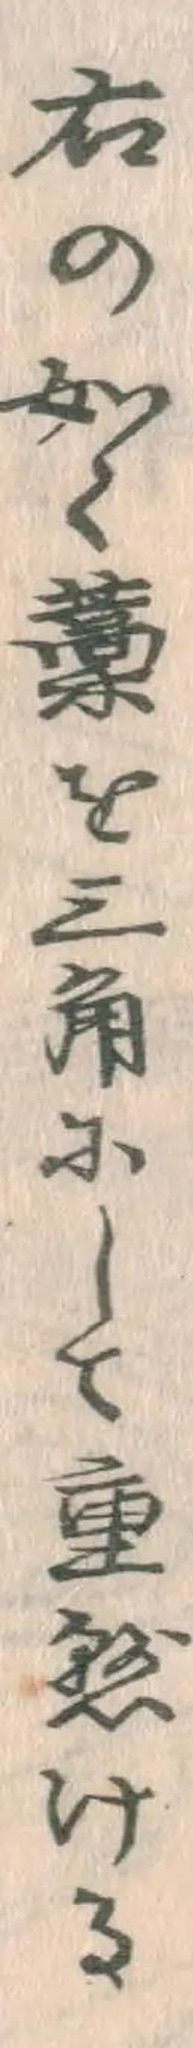右の如く藁を三角にして重懸ける
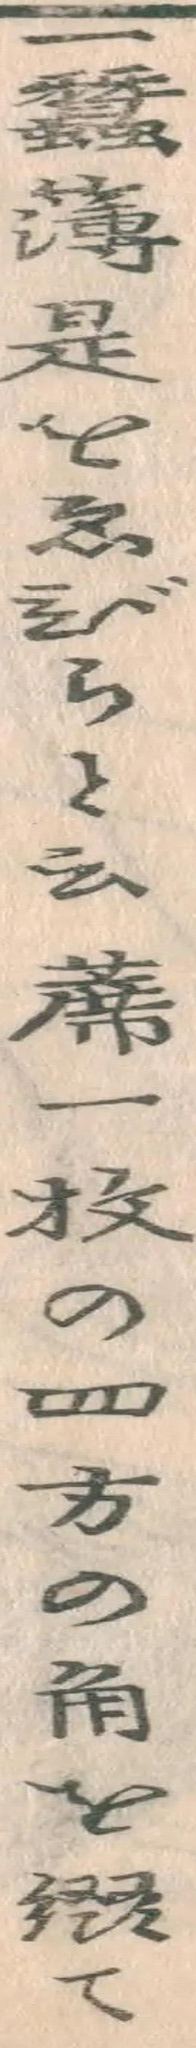一蚕簿是をゑびらと云蓆一枚の四方の角を綴て
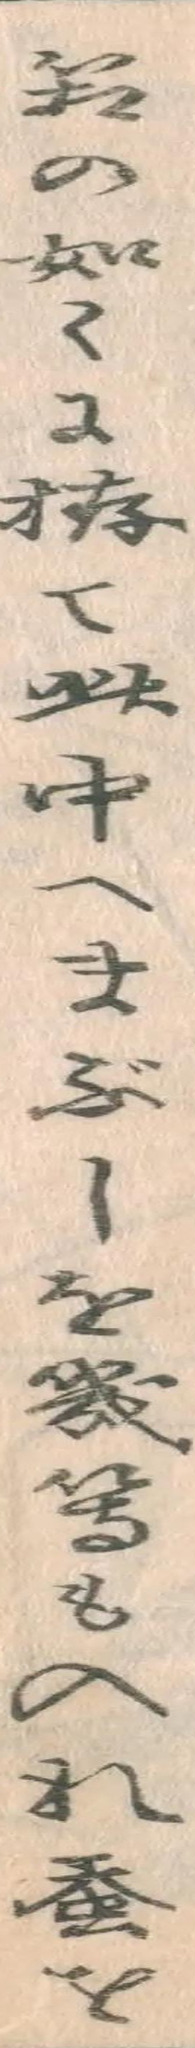箱の如くに拵て此中へまぶしを幾等も入れ蚕を
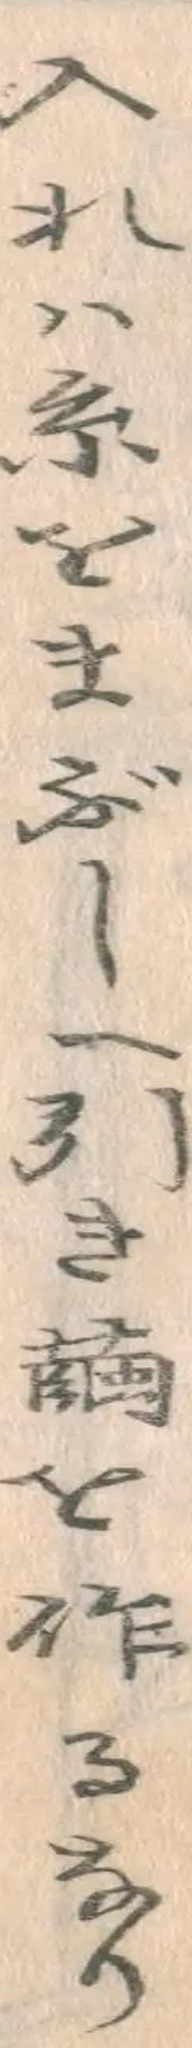入れは糸をまぶしへ引き繭を作るなり
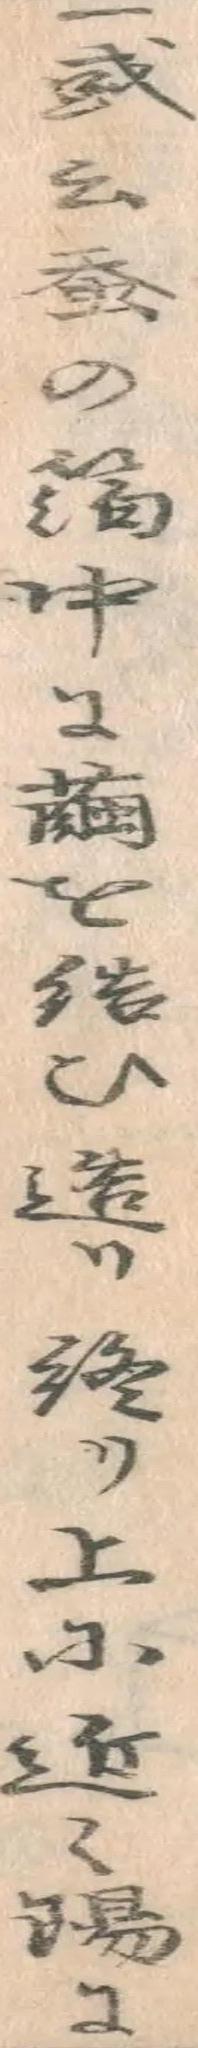一或云蚕の箔中に繭を結ひ造り終り上に近く陽に
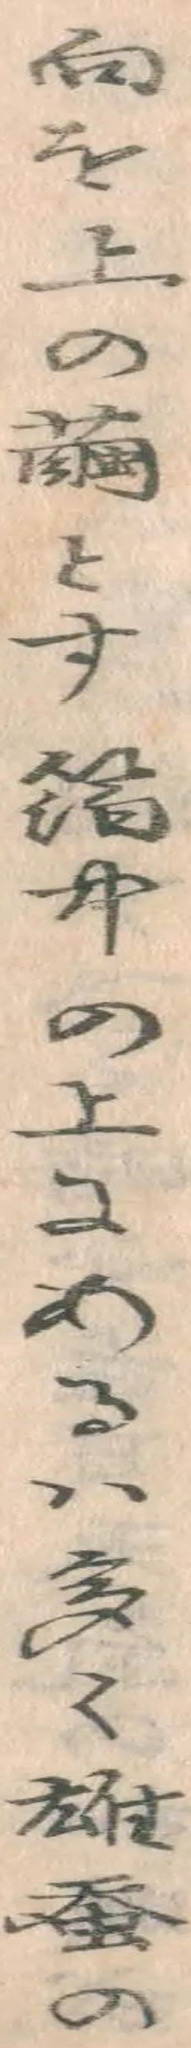向を上の繭とす箔中の上にあるは多く雄蚕の
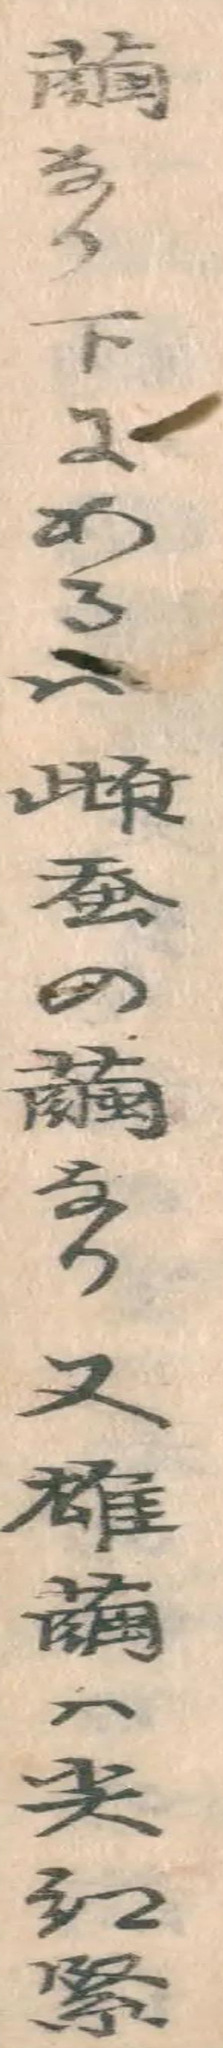繭なり下にあるは雌蚕の繭なり又雄繭は尖紅緊

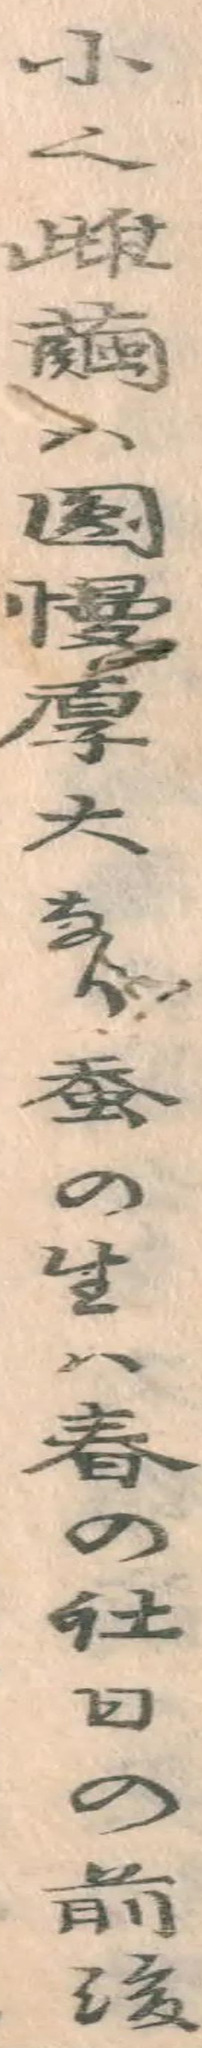小也雌繭は円慢厚大なり蚕の生は春の社日の前後
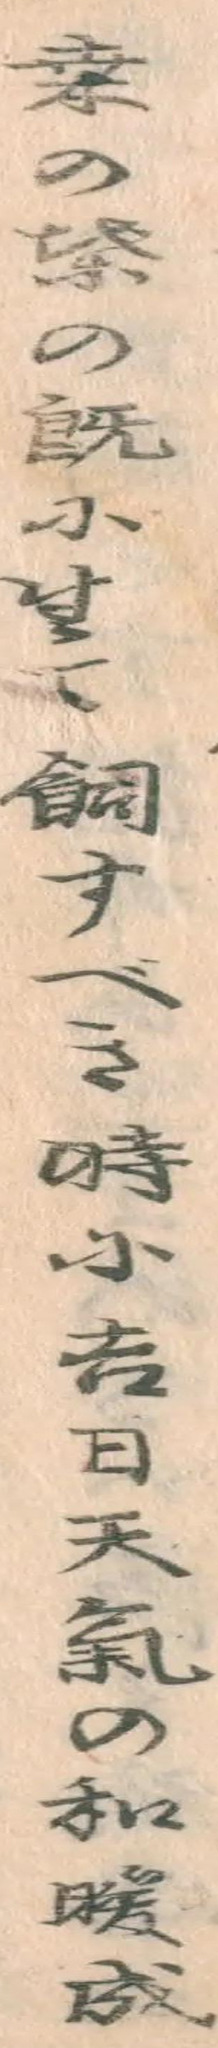桑の葉の既に生て飼すべき時に吉日天気の和暖成
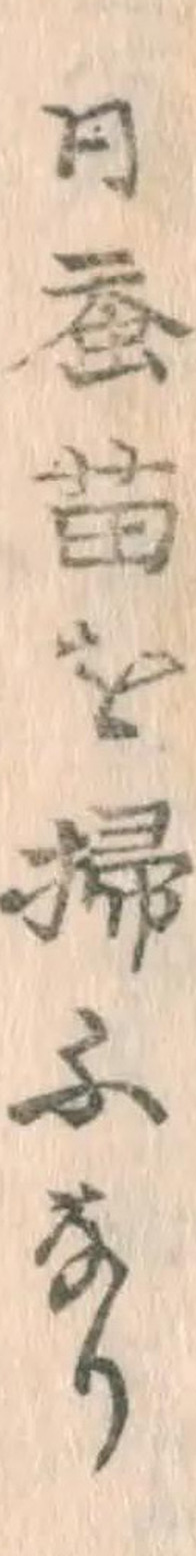日蚕苗を掃ふなり
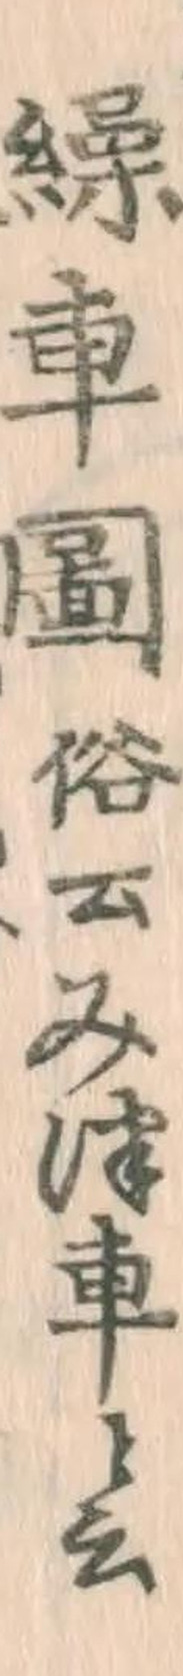繰車図俗云みつ車と云
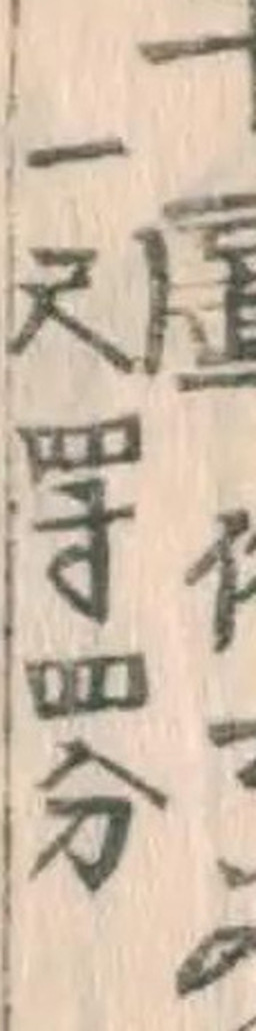一尺四寸四分
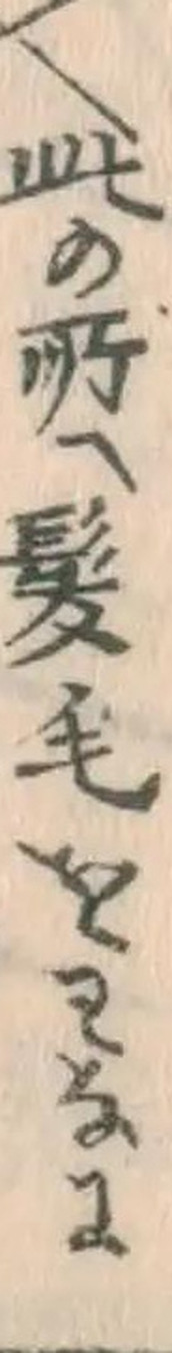此の所へ髪毛をわなに
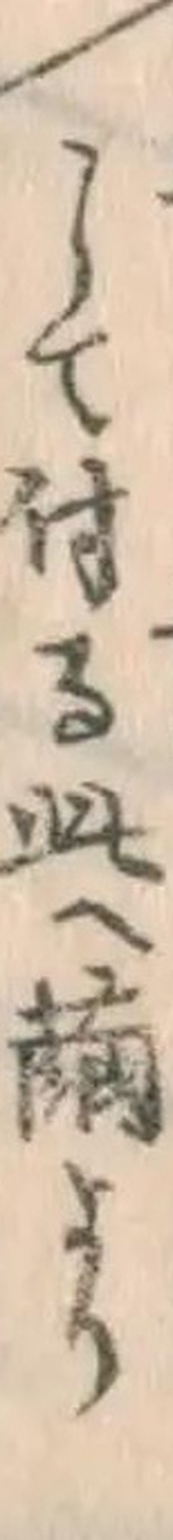して付る此へ繭より
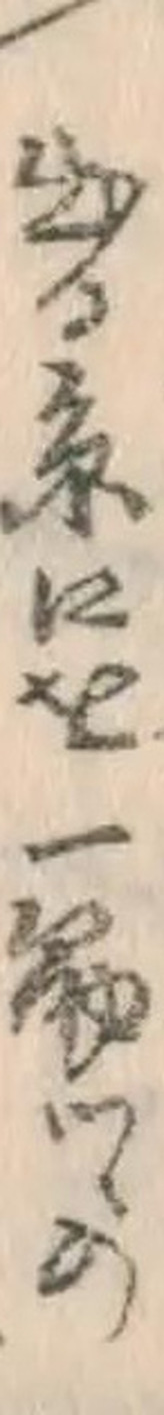出る糸口を一筋つゝの
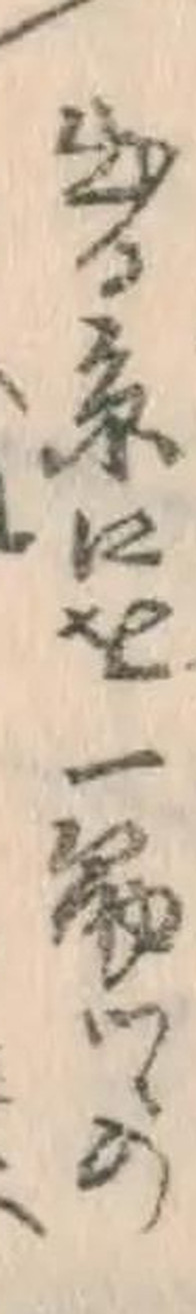出る糸口を一筋つゝの
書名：機織彙編 5巻. [1]
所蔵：国立国会図書館 National Diet Library, JAPAN
